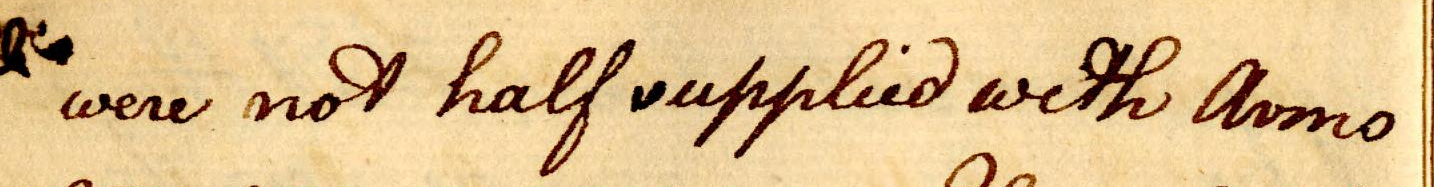were not half supplied with Ammo
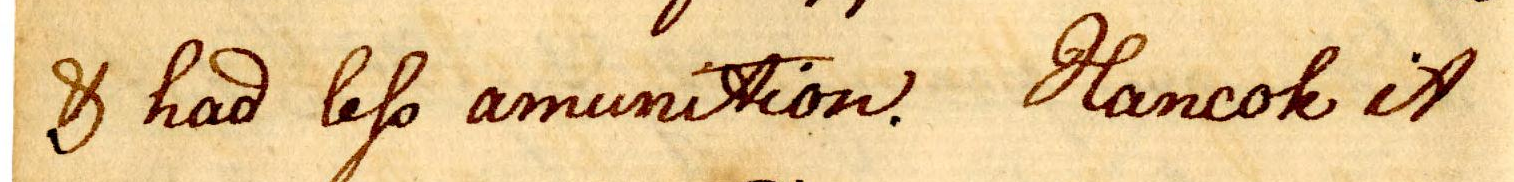& had less ammunition. Hancock it
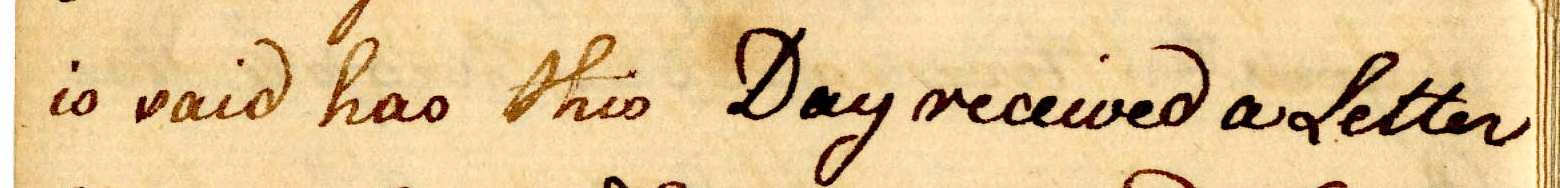is said has this Day received a Letter
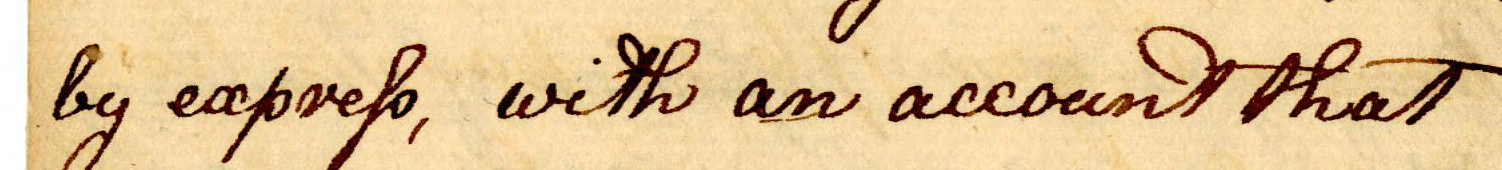by express, with an account that
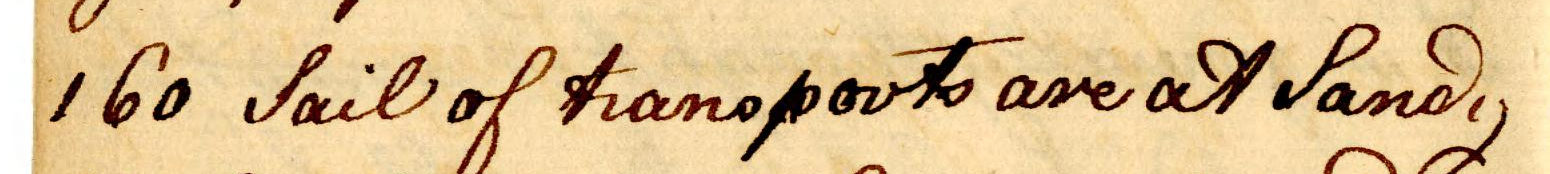160 Sail of transports are at Sandy
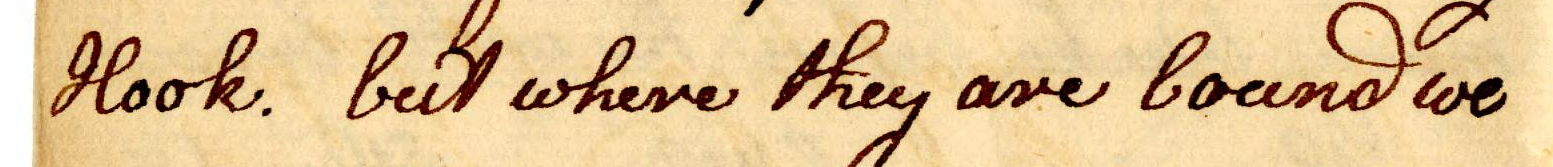Hook. but where they are bound we
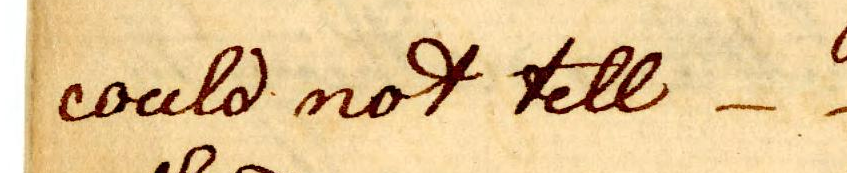could not tell-
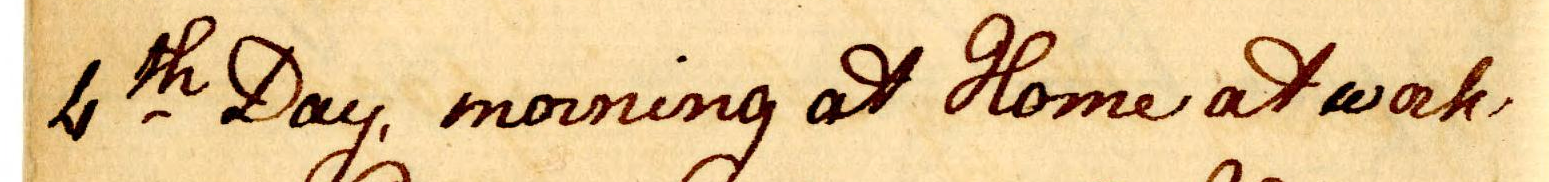4^th Day, morning at Home at work,
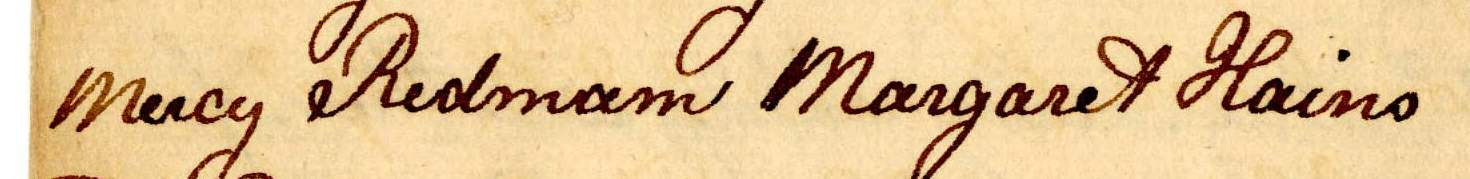Mercy Redmam Margaret Hains
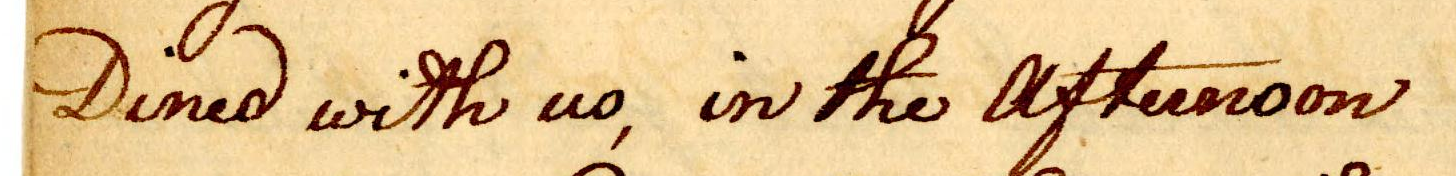Dined with us, in the Afternoon
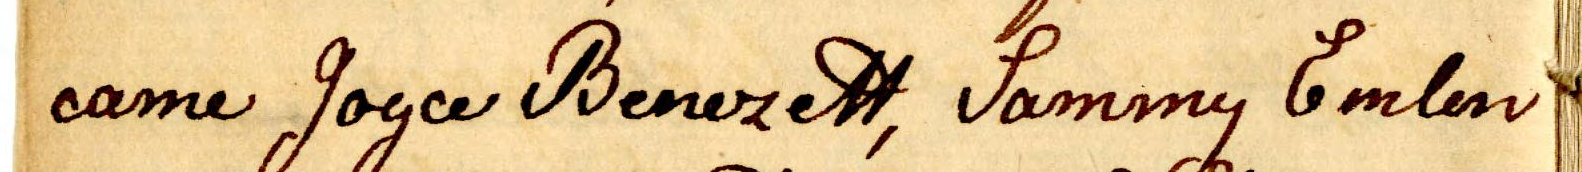came Joyce Benezett, Sammy Emlen
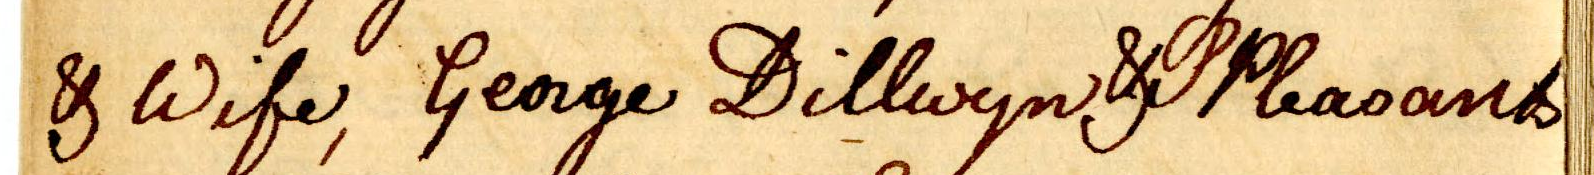& Wife, George Dillwyn & P Pleasants
